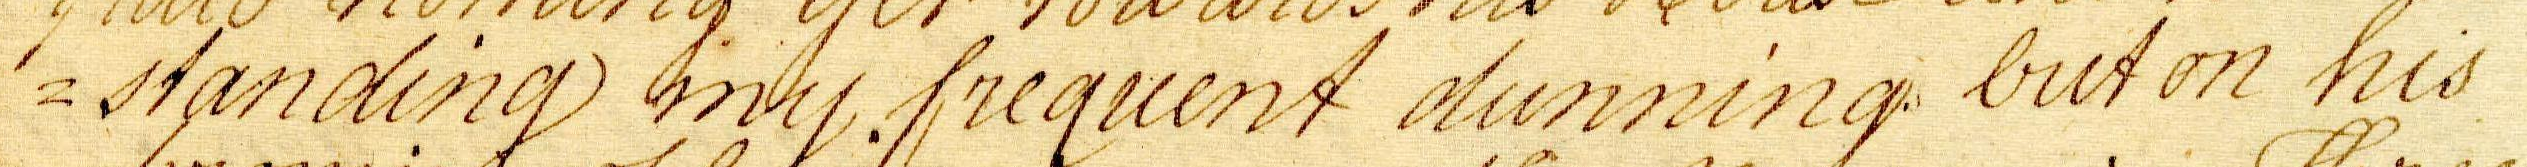-standing my frequent dunning but on his
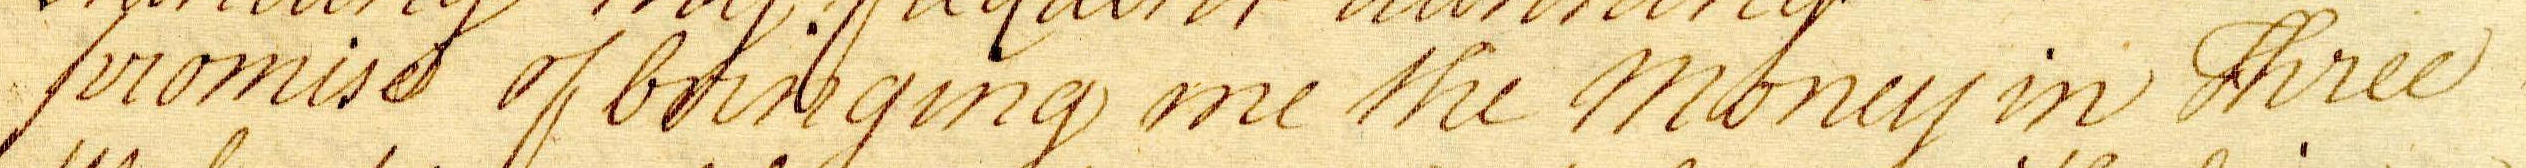promise of bringing me the Money in Three
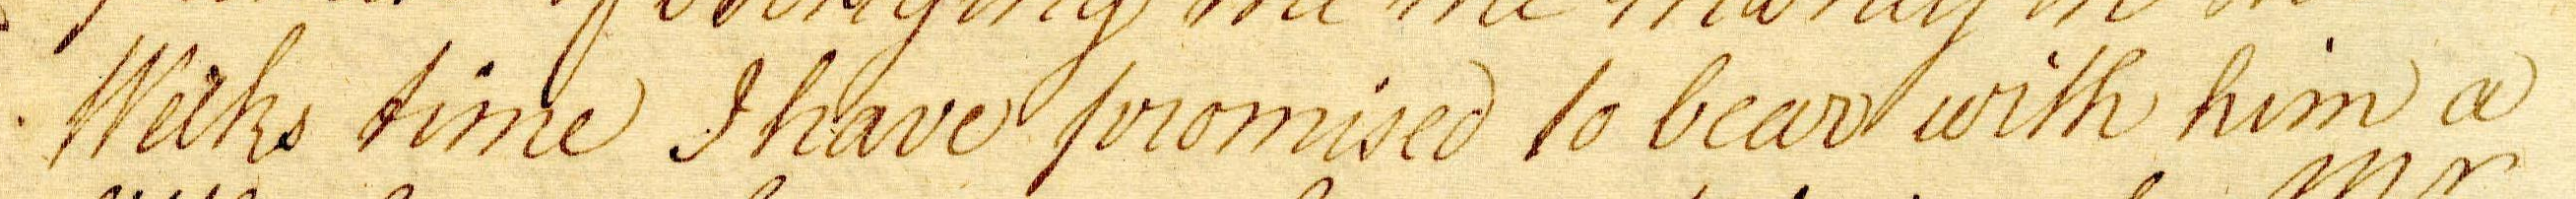Weeks time I have promised to bear with him a
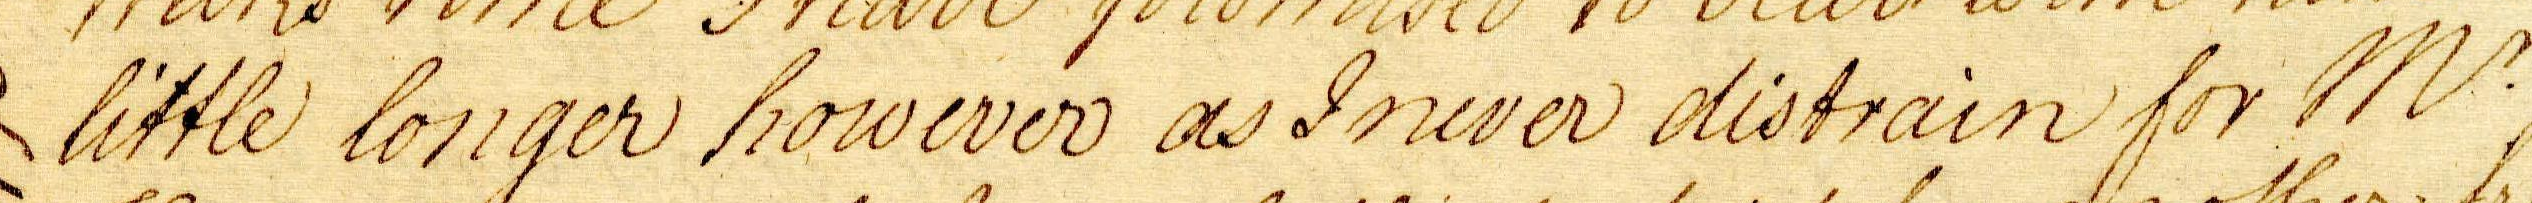little longer however as I never distrain for M^r.
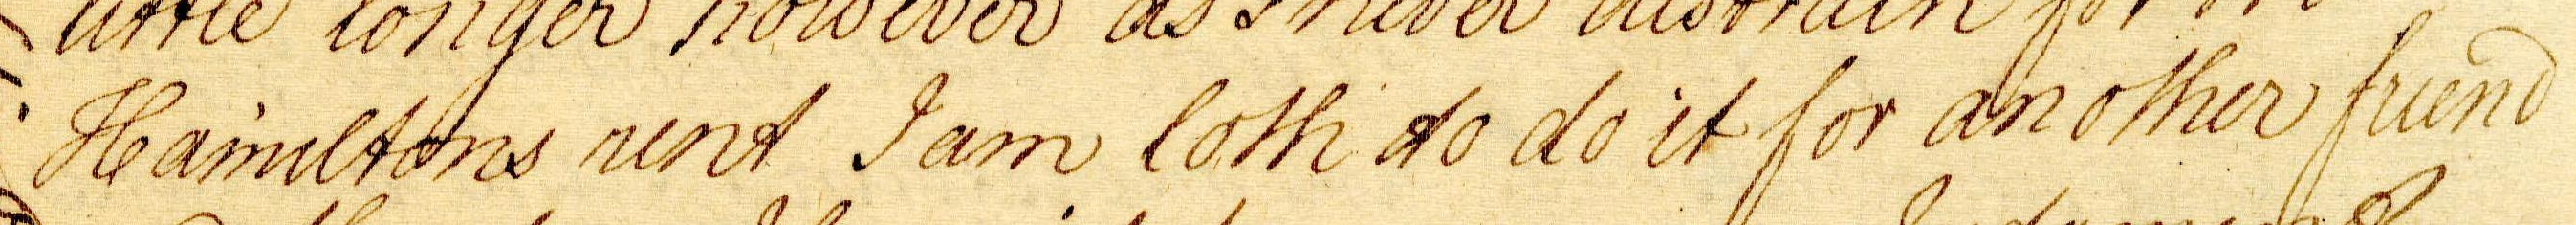Hamiltons rent I am loth to do it for another friend
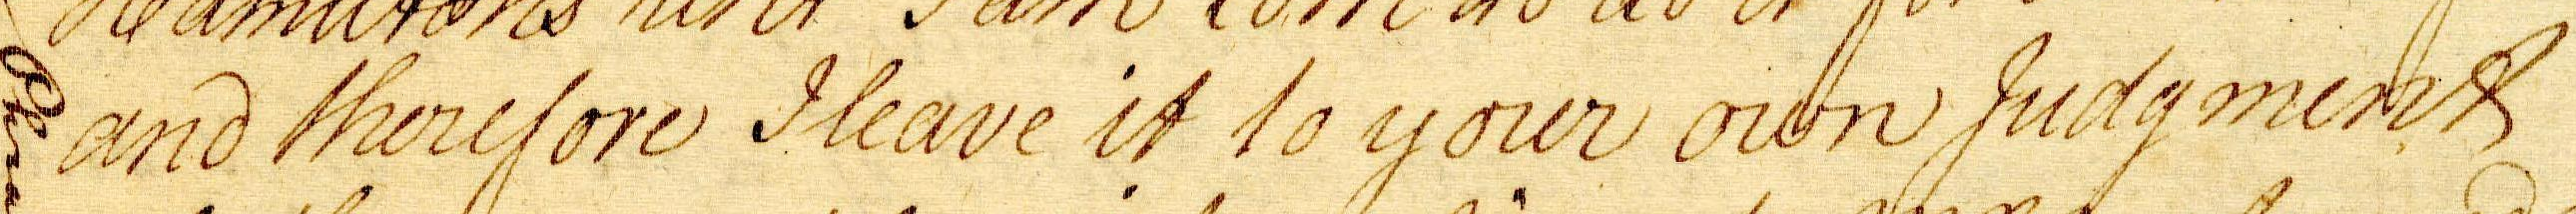and therefore I leave it to your own Judgment &
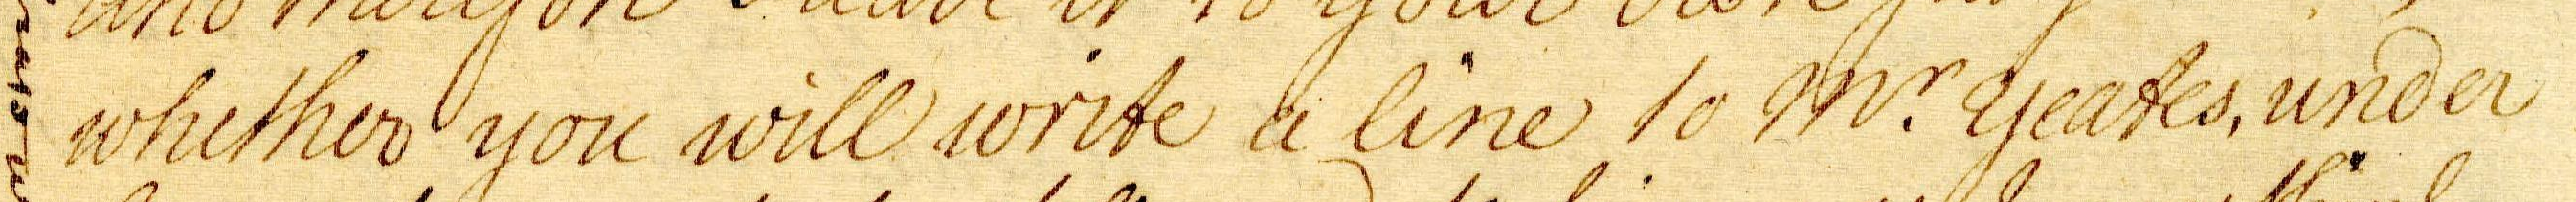whether you will write a line to M^r. Yeates, under
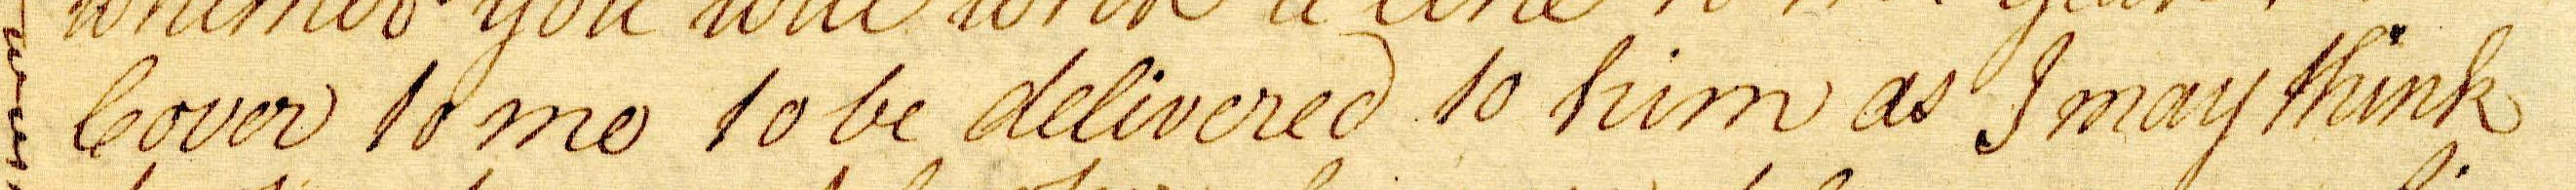Cover to me to be delivered to him as I may think
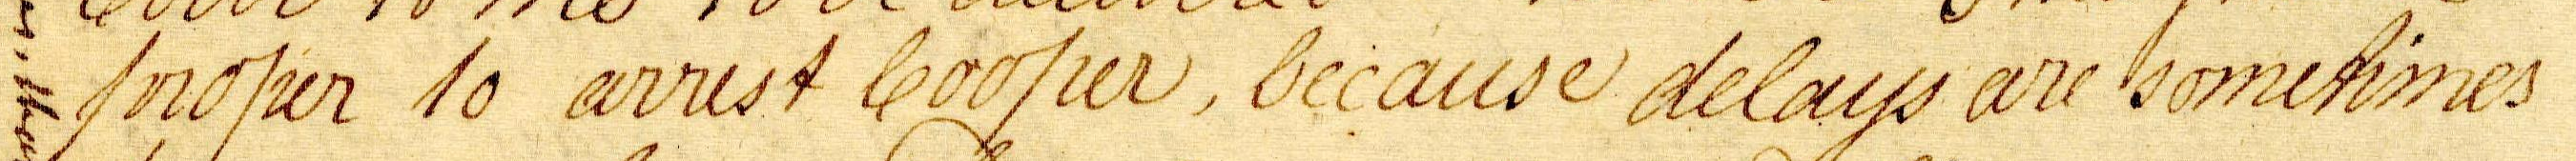proper to arrest Cooper, because delays are sometimes
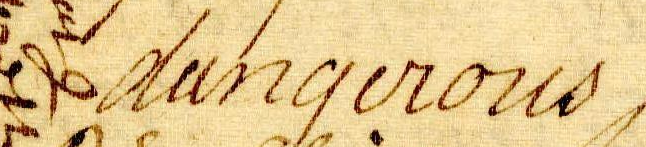dangerous I am Dear
